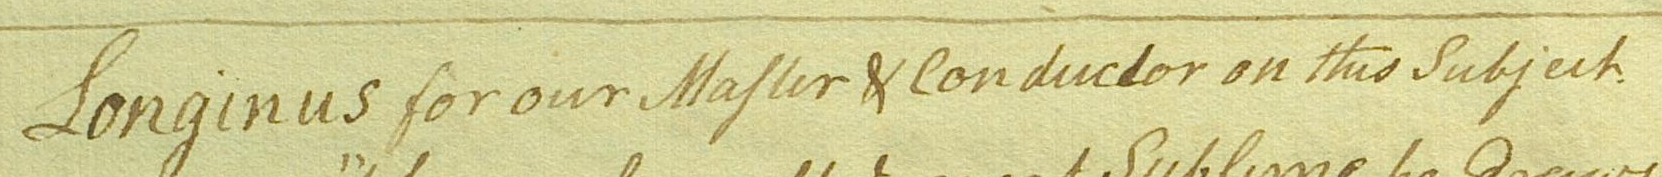Longinus for our Master & Conductor on this Subject.
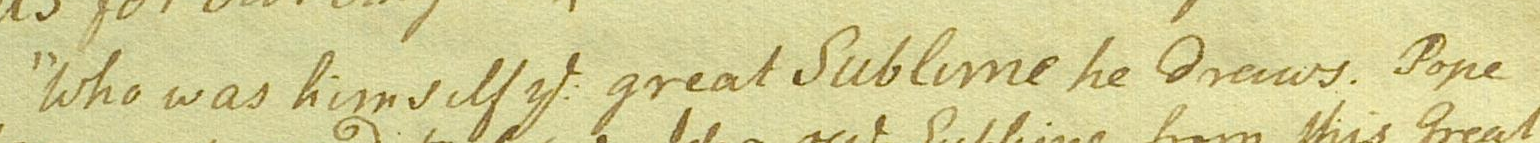"Who was himself y^e: great Sublime He draws. Pope
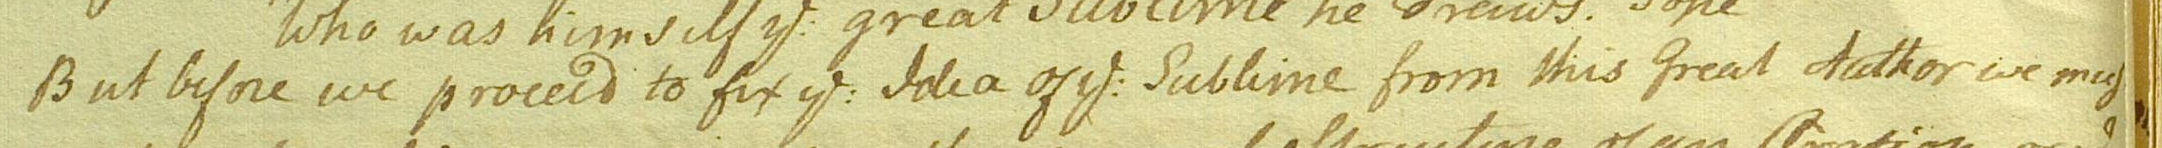But before we proceed to fix y^e: Idea of y^e: Sublime from this Great Author we must
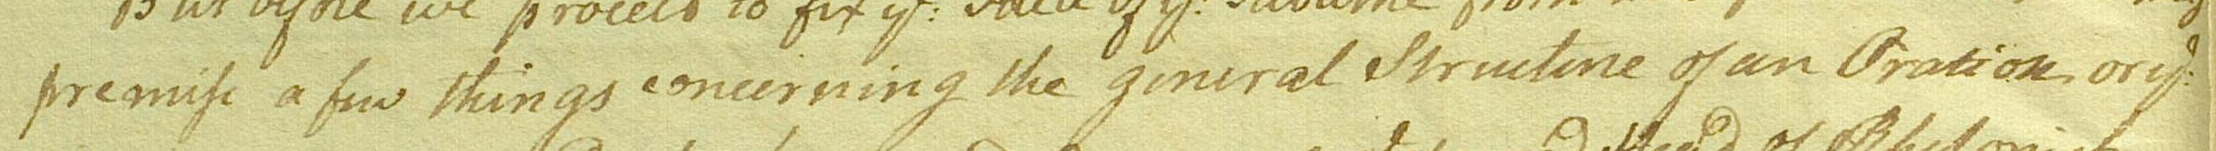premise a few things concerning the general structure of an Oration or y^e
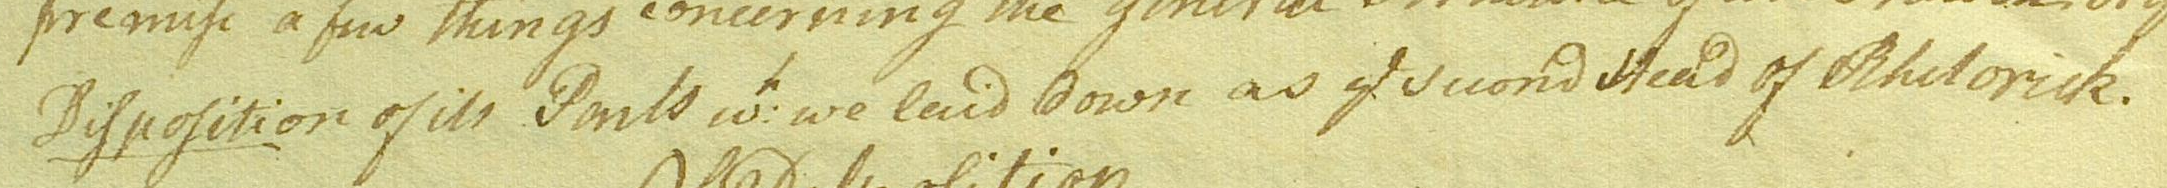Disposition of its Points w^h we laid down as y^e second Head of Rhetorick.
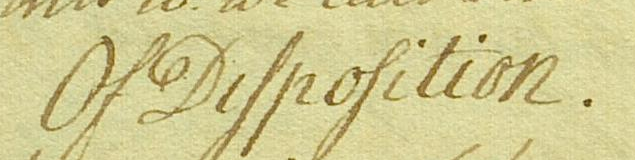Of Disposition.
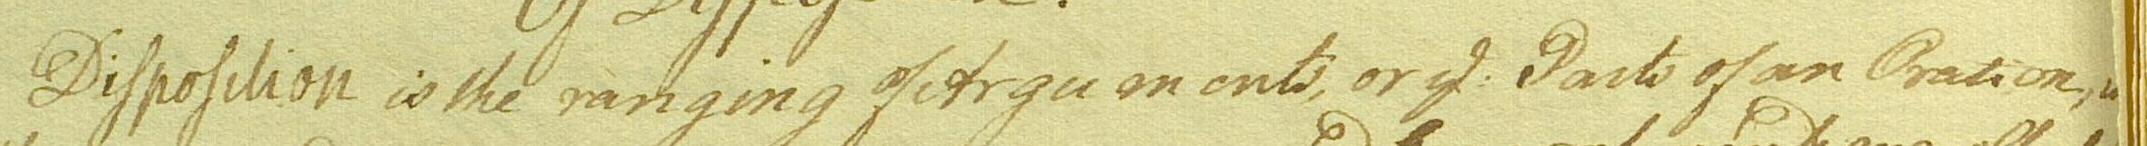Disposition is the ranging of Arguments, or y^e: Parts of an Oration, in
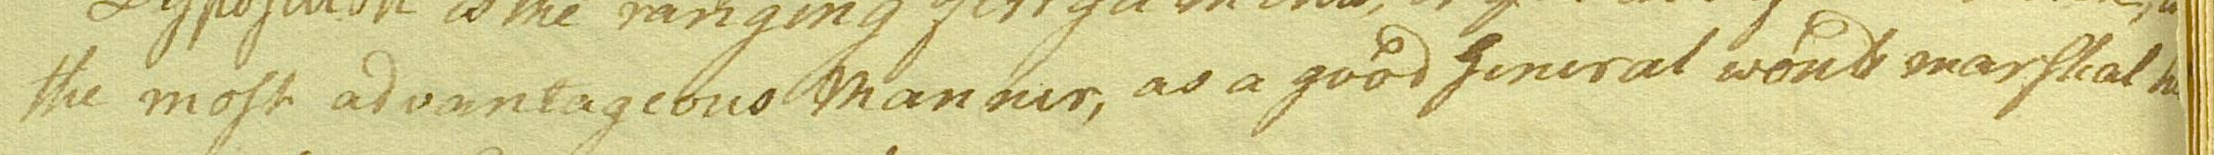the most advantageous Manner, as a good General would Marshal his
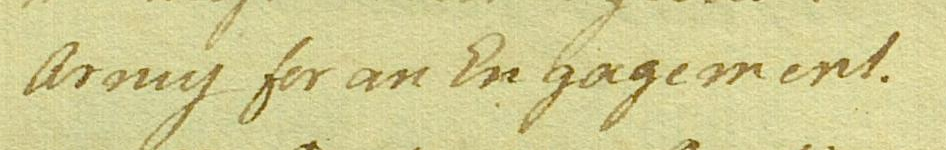Army for an Engagement.
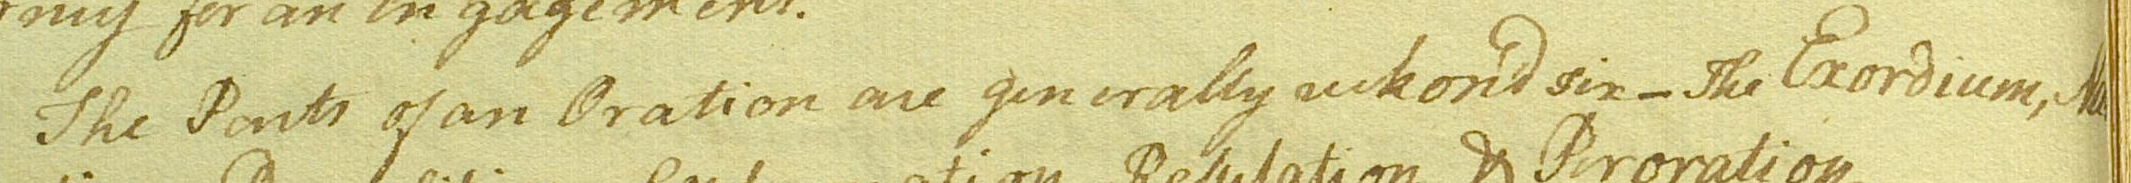The Parts of an Oration are generally reckon'd six- The Exordium, Na
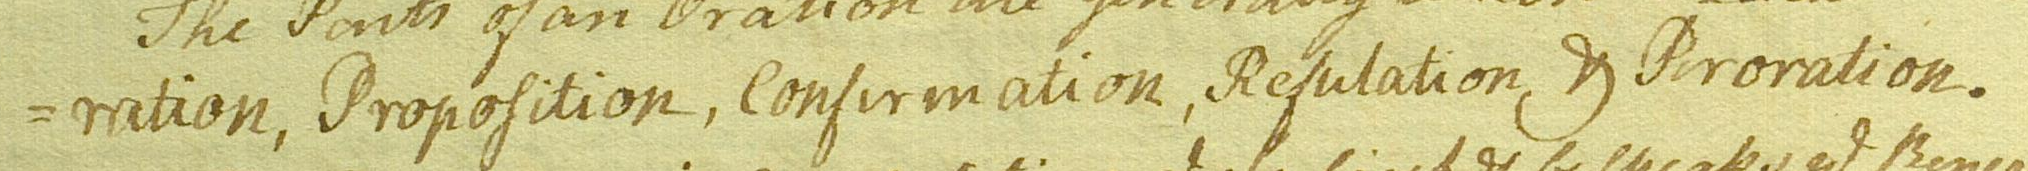-ration, Proposition, Confirmation, Refutation & Peroration.
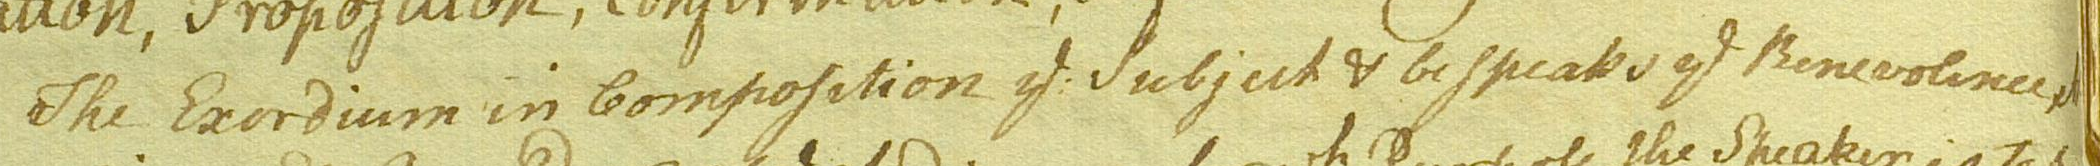The Exordium in Composition y^e Subject & bespeaks y^e Benevolence, In
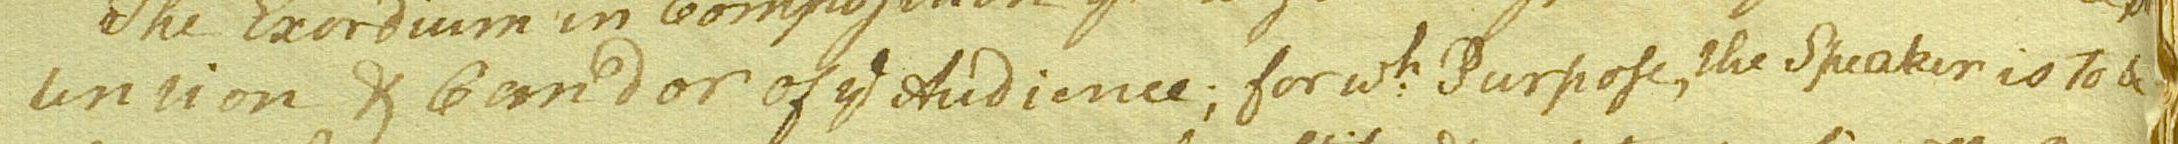tention & Candor of y^e Audience; for w^h Purpose, the Speaker is to be
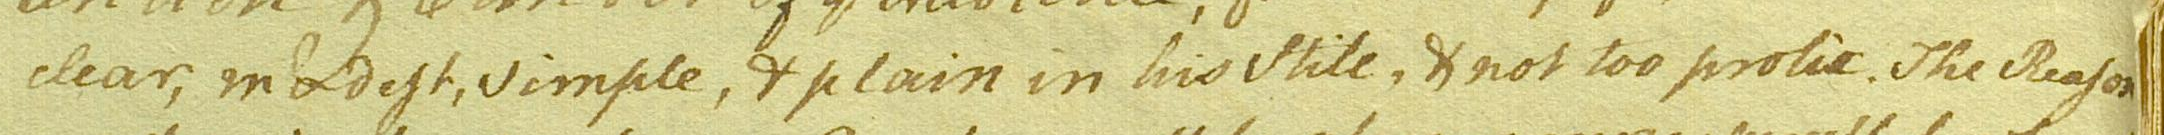clear, modest, simple, & plain in his Stile, & not too prolix. The Reason
